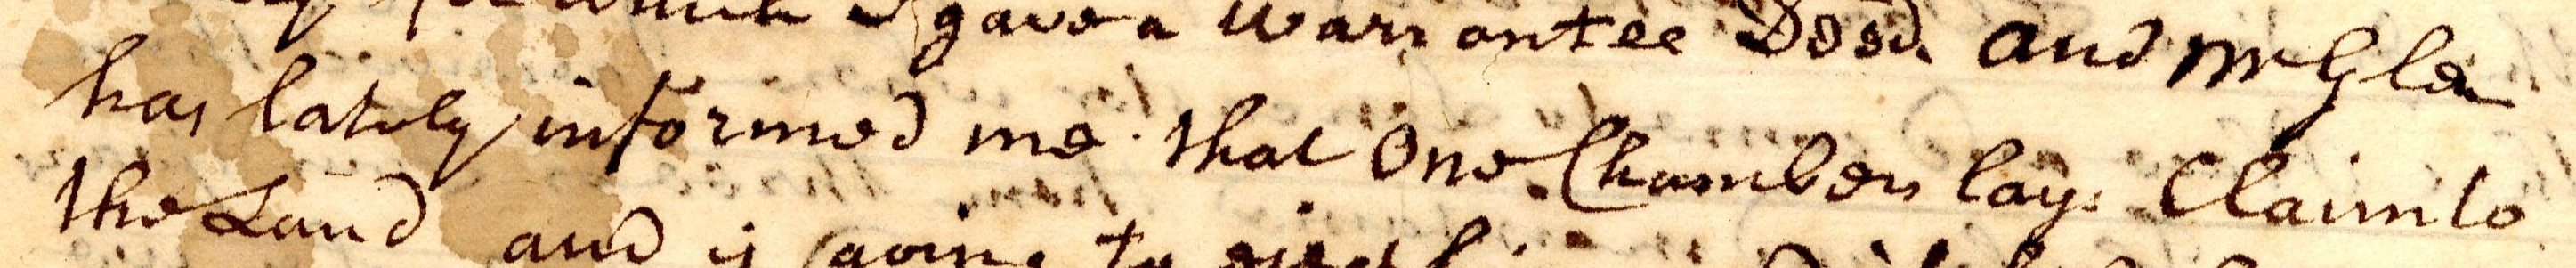has lately informed me that One Chamber lays Claim to
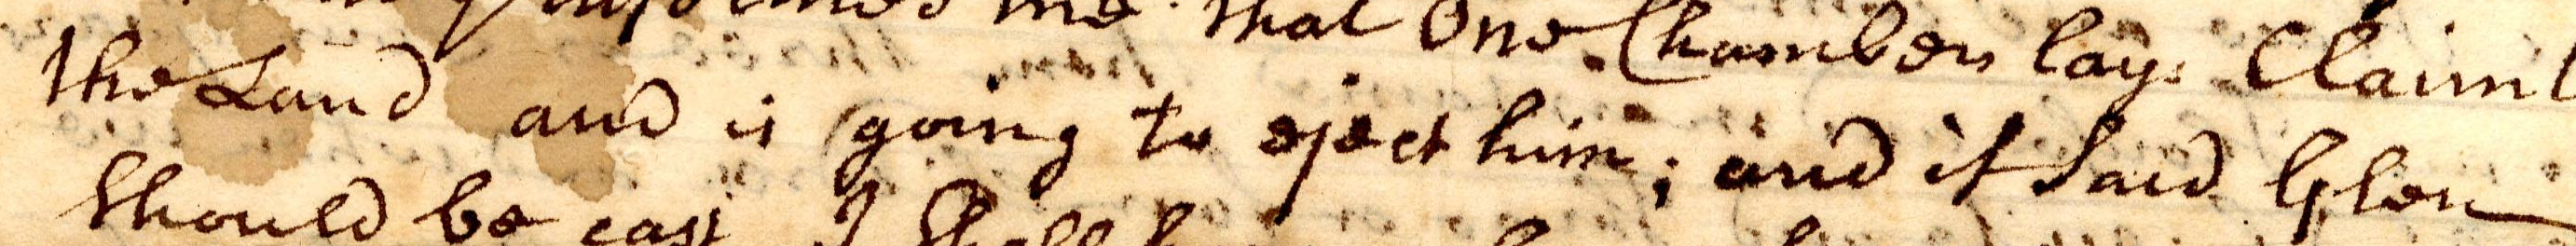the Land and is going to eject him; and if said Glen
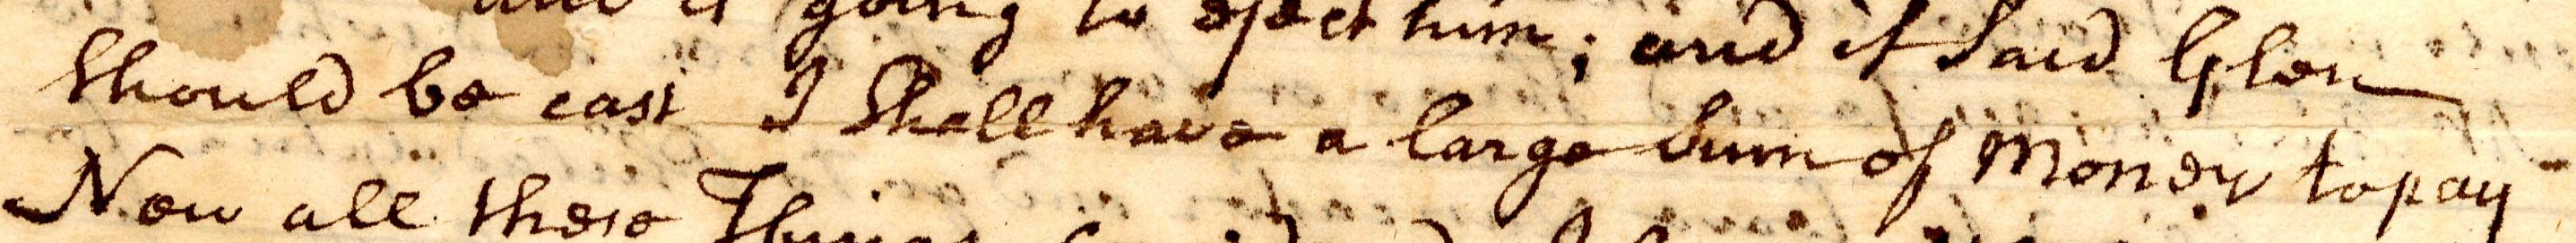should be cast I shall have a large sum of Money to pay-
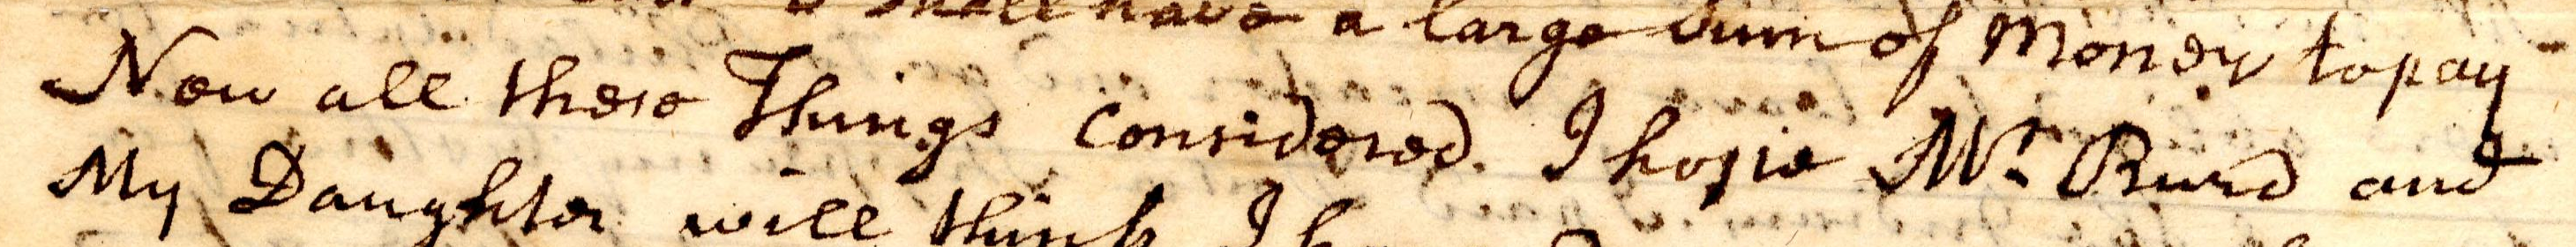Now all these Things considered. I hope M^r. Burd and
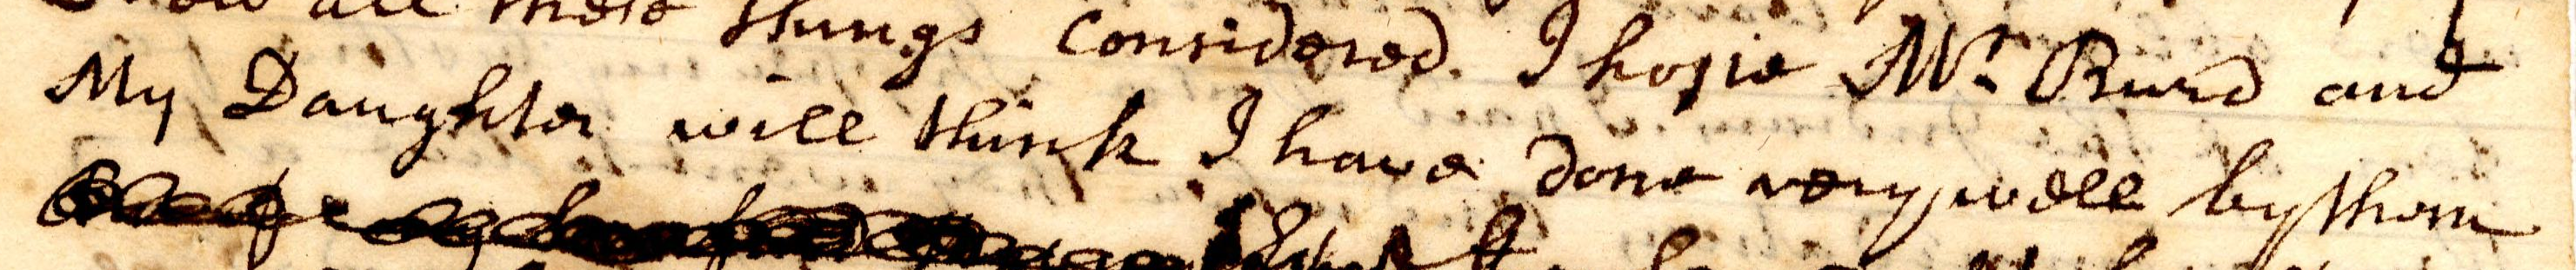My Daughter will think I have done very well by them.
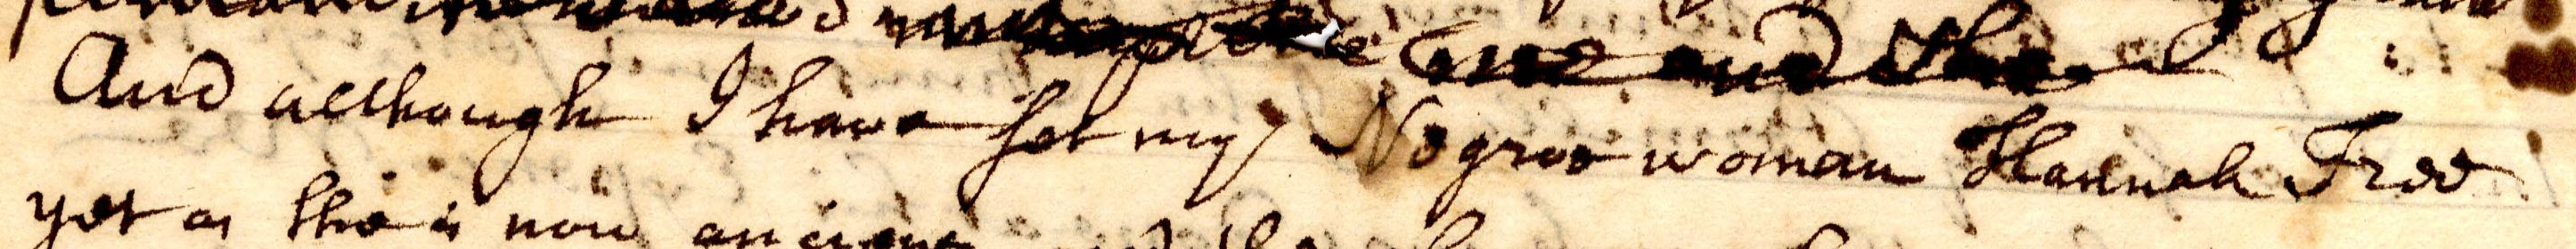And although I have set my Negroe woman Hannah Free
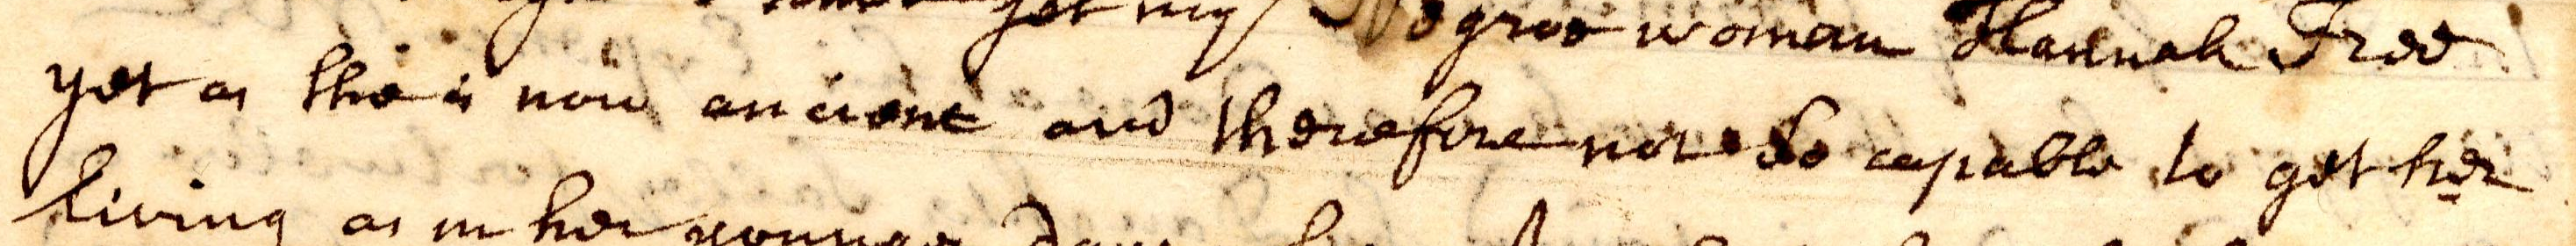yet as she is now ancient and therefore not so capable to get her
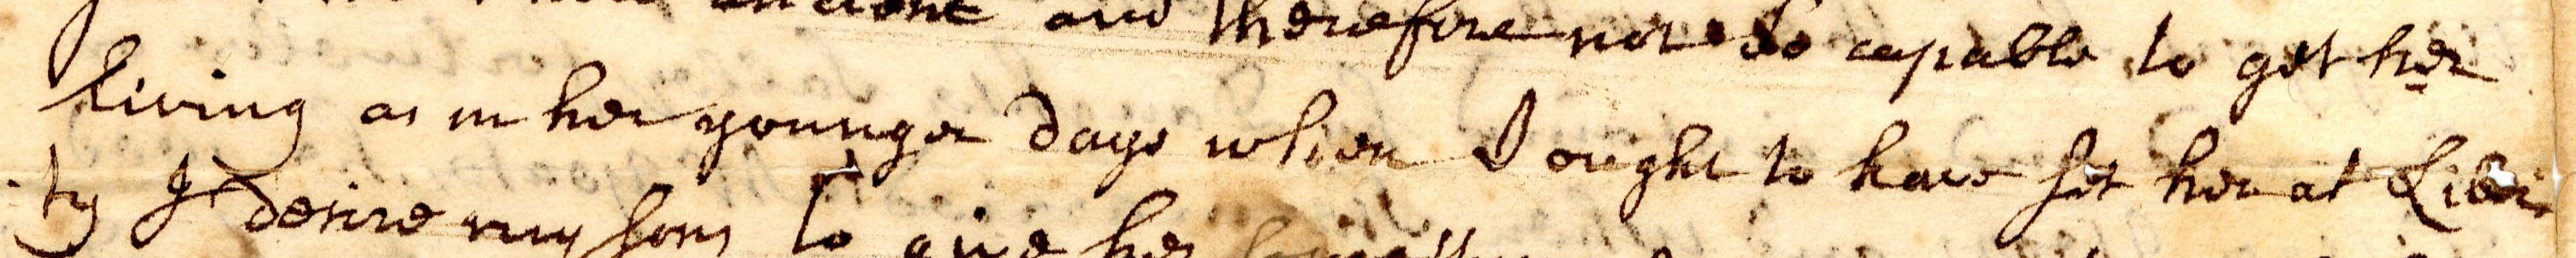living as in her younger days when I ought to have set her at Liber
